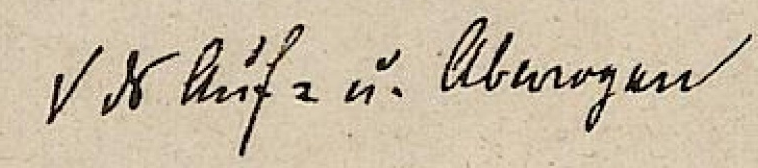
V ds Auf- u. Abwogen
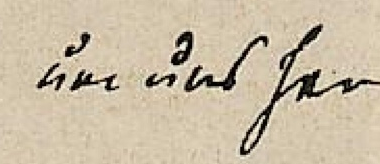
um uns her
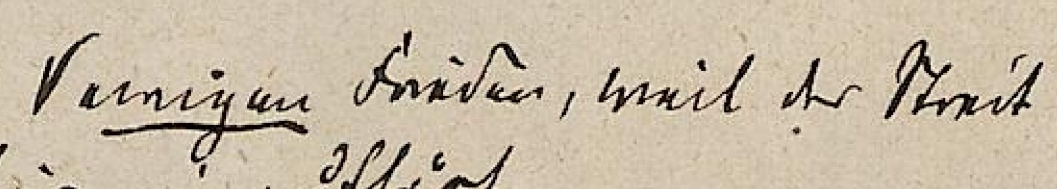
V ewigen Frieden, weil der Srreit
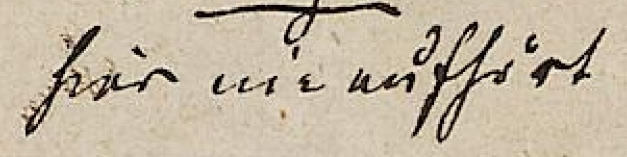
hier nie aufhört
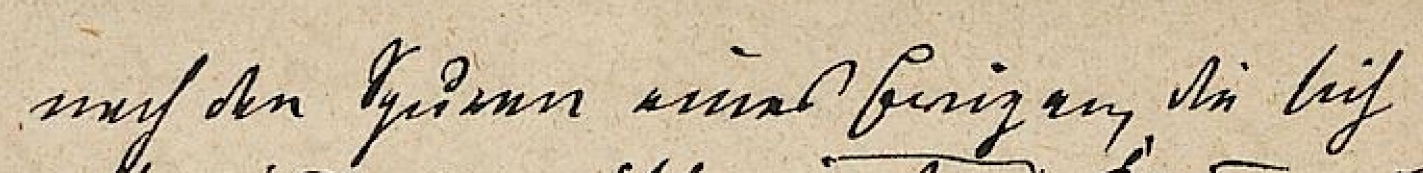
nach den Spuren eines Ewigen, die sich
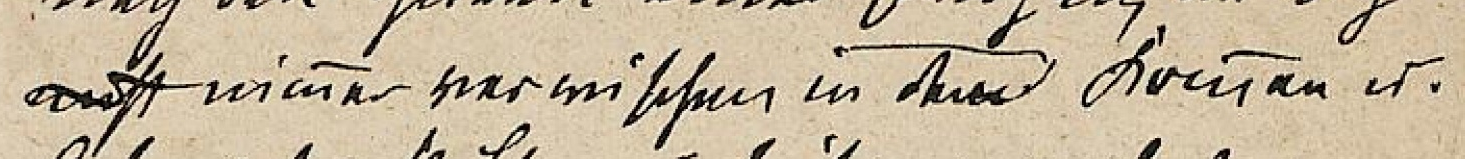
nicht nimer vermischen in dm Komen u.
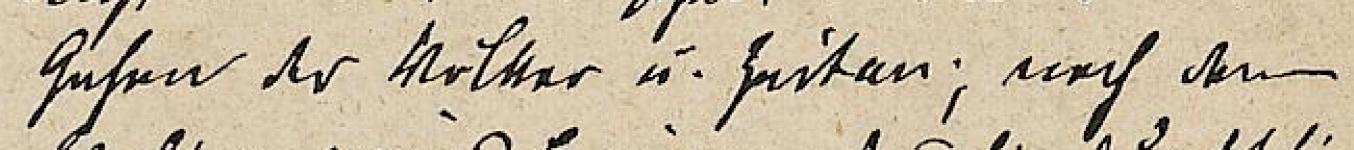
Gehen der Völker u. Zeiten; nach dem
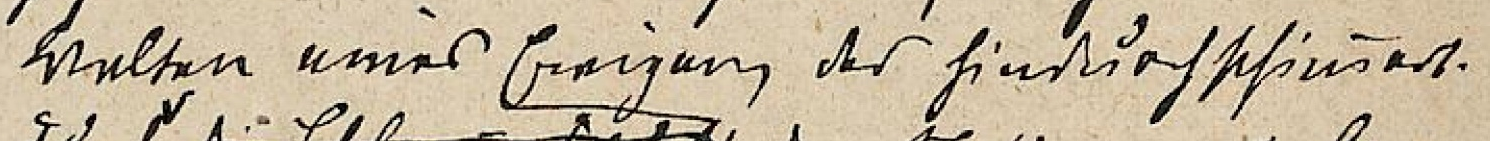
Walten eines Ewigen, des hindurchschimert.
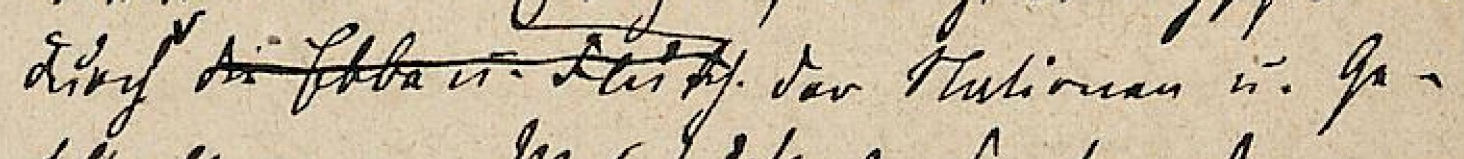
durch die Ebben u. Flut der Nationen u. Ge¬
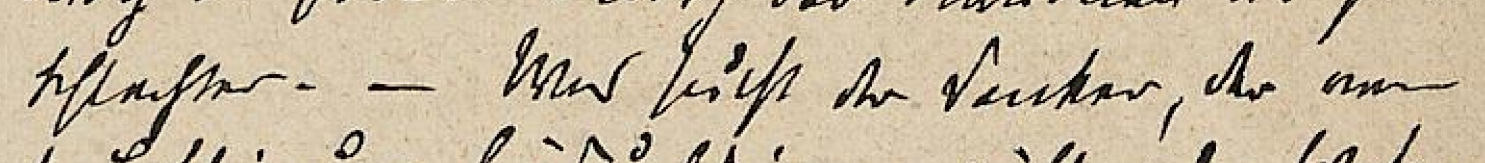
schlechter. _ Was sucht der Denker, der von
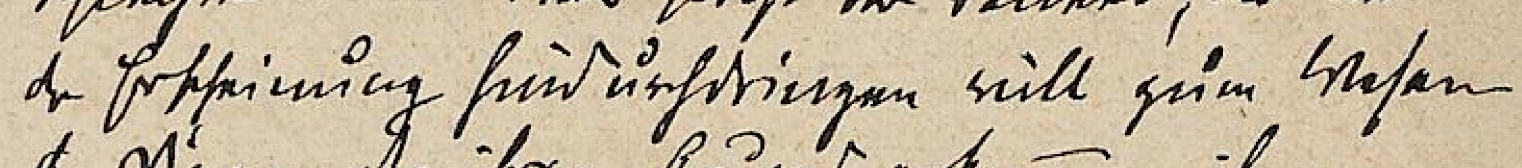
dr Erscheinung hindurchdringen will zum Wesen
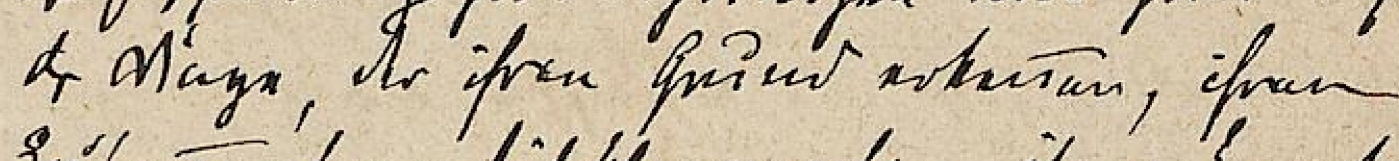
dr Dinge, der ihren Grund erkennen, ihren
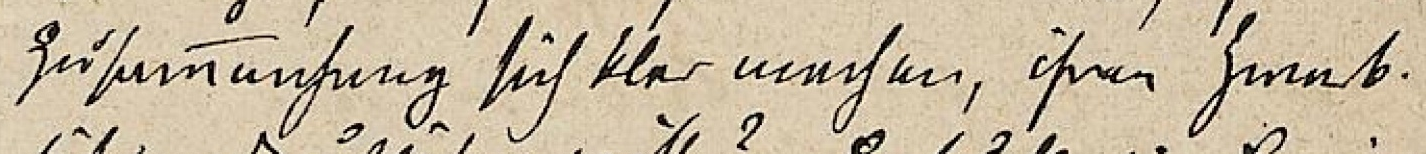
Zusamenhang sich klar machen, ihren Zweck.
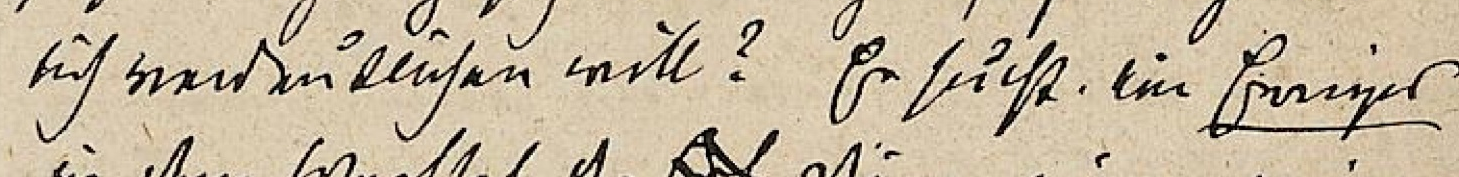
sich verdeutlichen will? Er sucht ein Ewiges
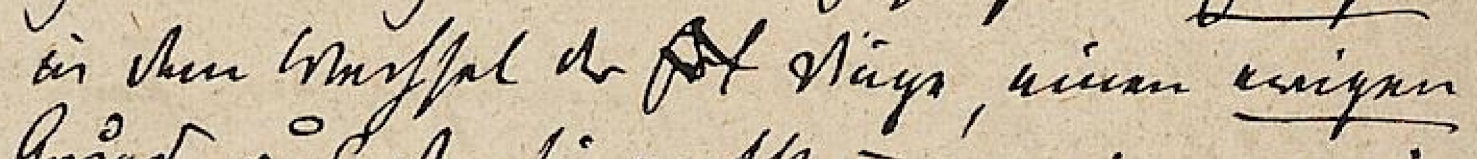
in dem Wechsel der Ers Dinge, einen ewigen
